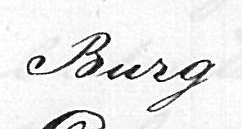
Burg
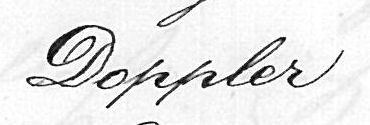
Doppler
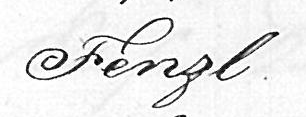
Fenzl
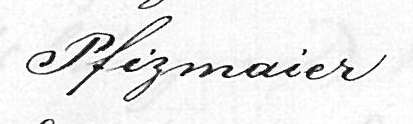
Pfizmaier
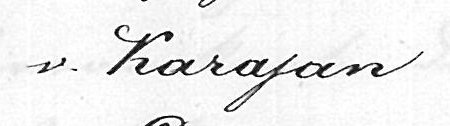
v. Karajan
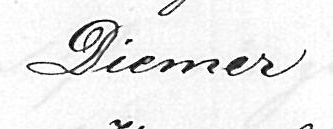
Diemer
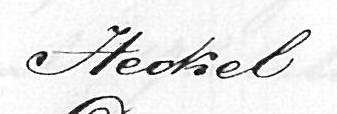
Heckel
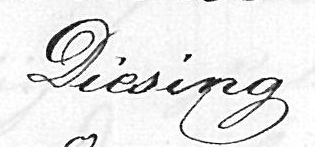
Diesing
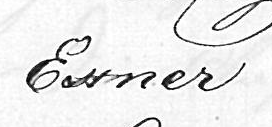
Exner
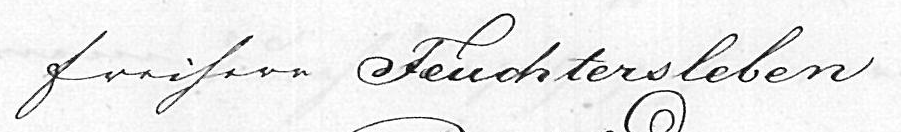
Freiherr Feuchtersleben
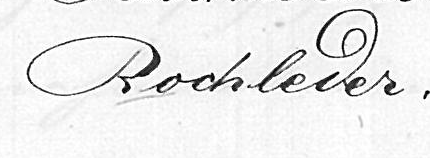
Rochleder
